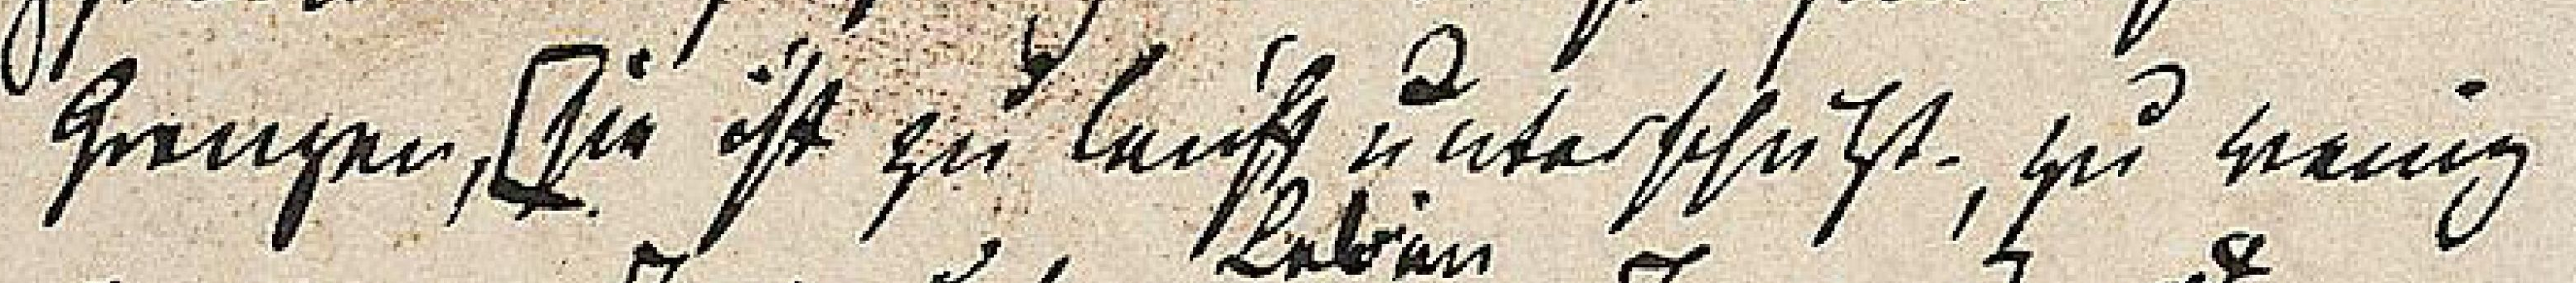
Grenzen [ sie ist zu leicht unterschäzt, zu wenig
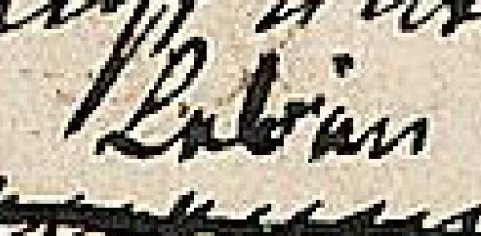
Leben
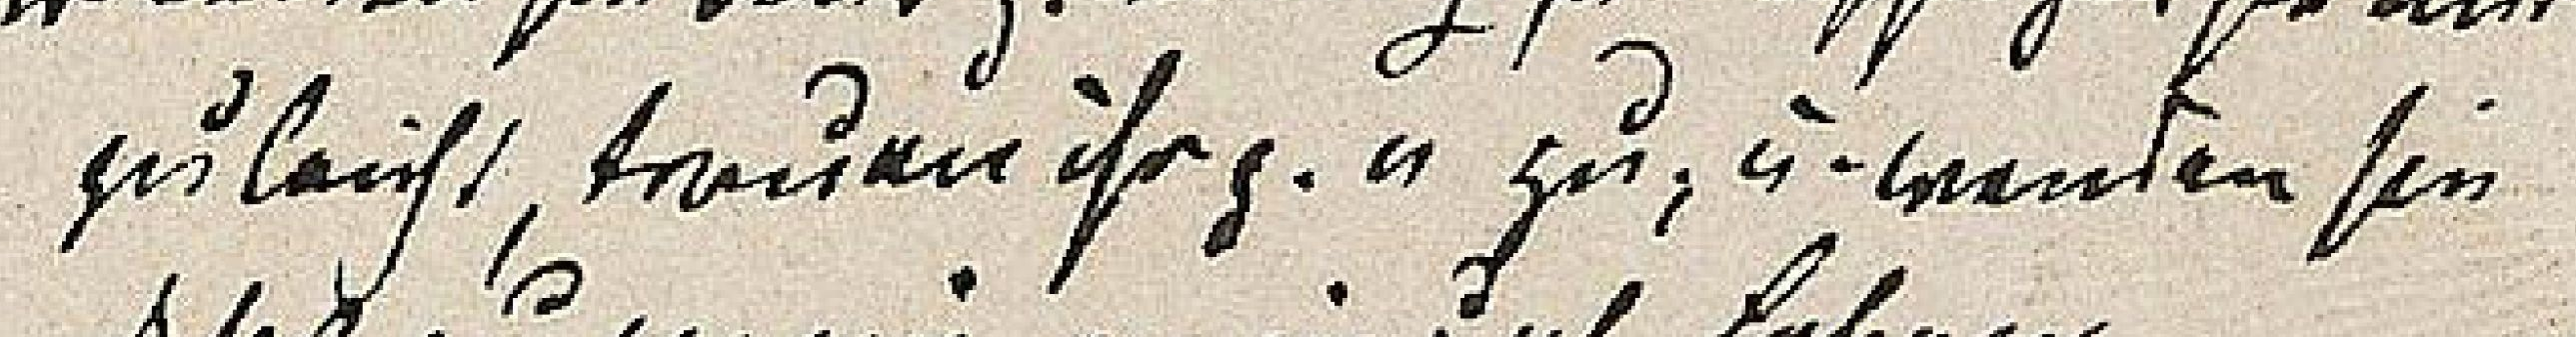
zuleicht, trauen ihr z. " zu, u wenden sie
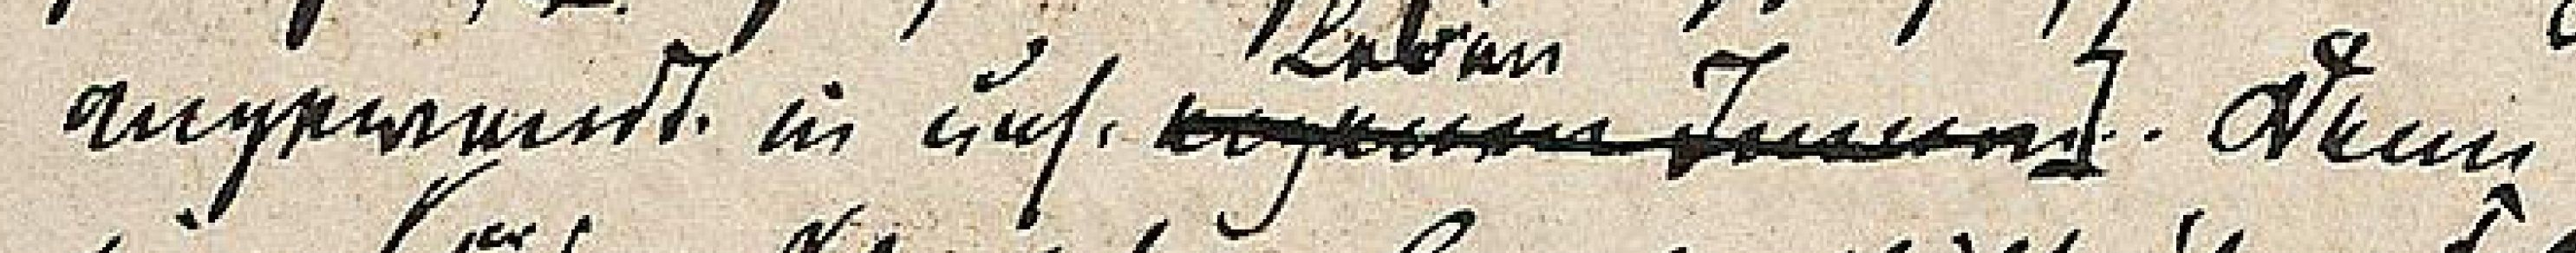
angewandt in uns. eigene Inern.]. Denn
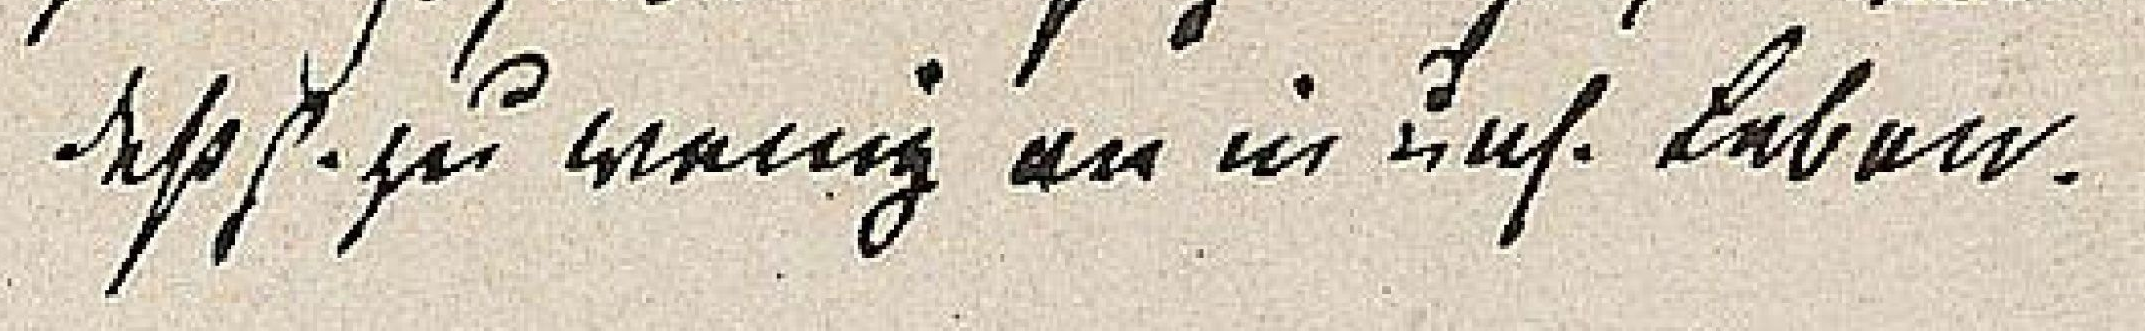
daß s. zu wenig an in uns. Leben.
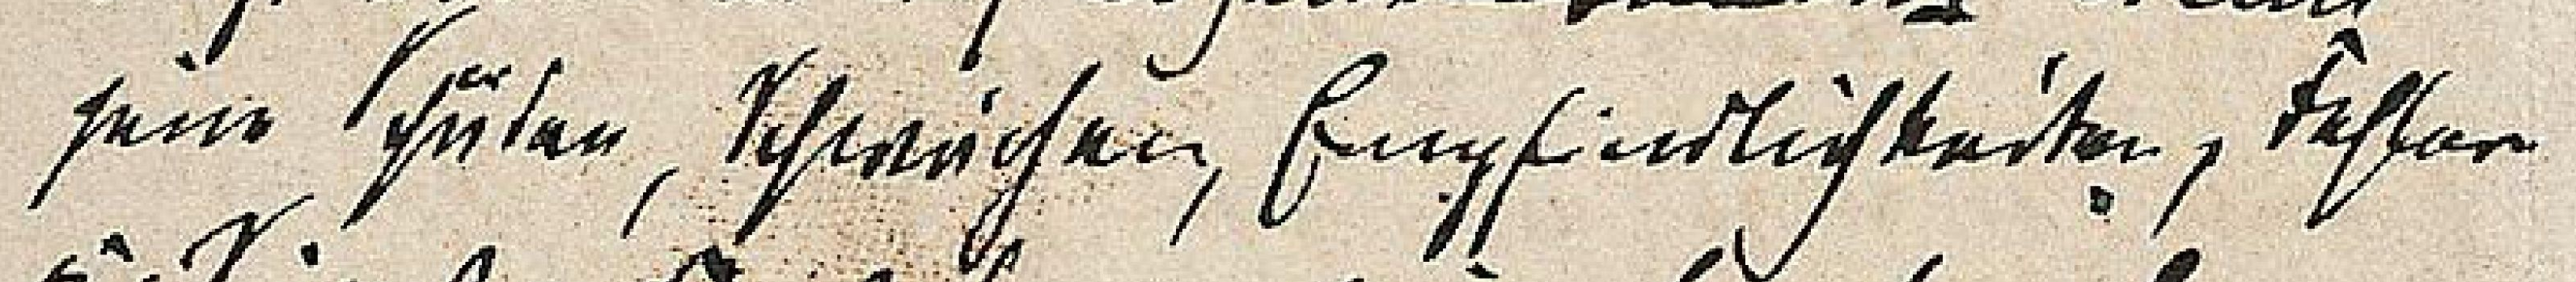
jene Schäten, Schwächen. Empfindlichkeiten, Fehler
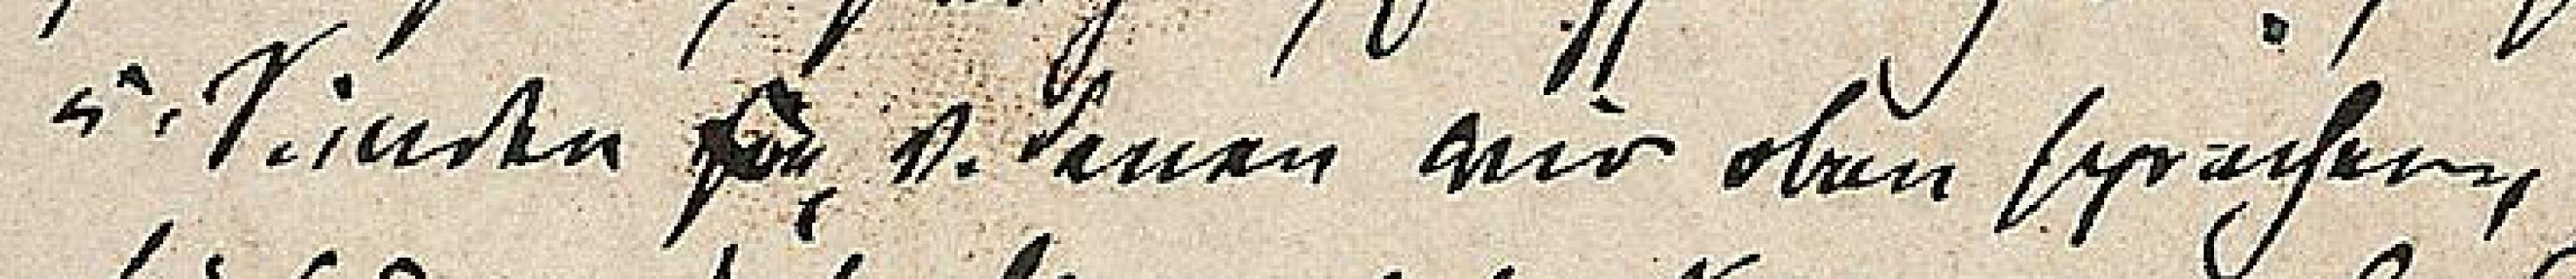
u. Sünden so. v. denen wir eben sprachen,
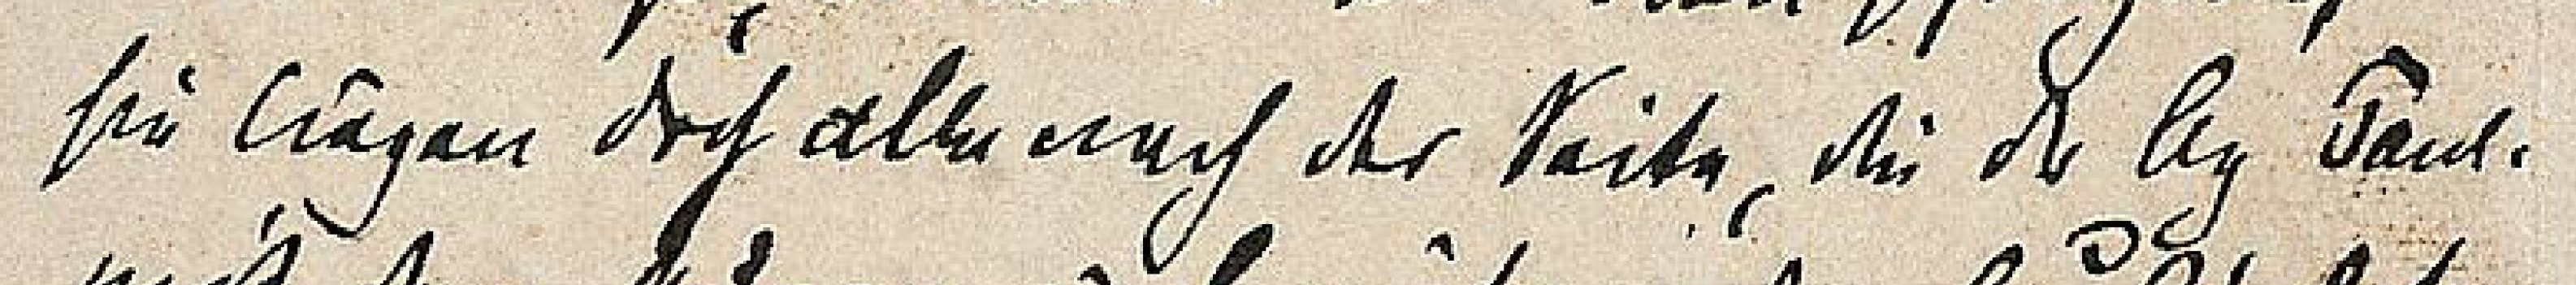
sie liegen doch alle nach der Seite, die dr Ap. Paul.
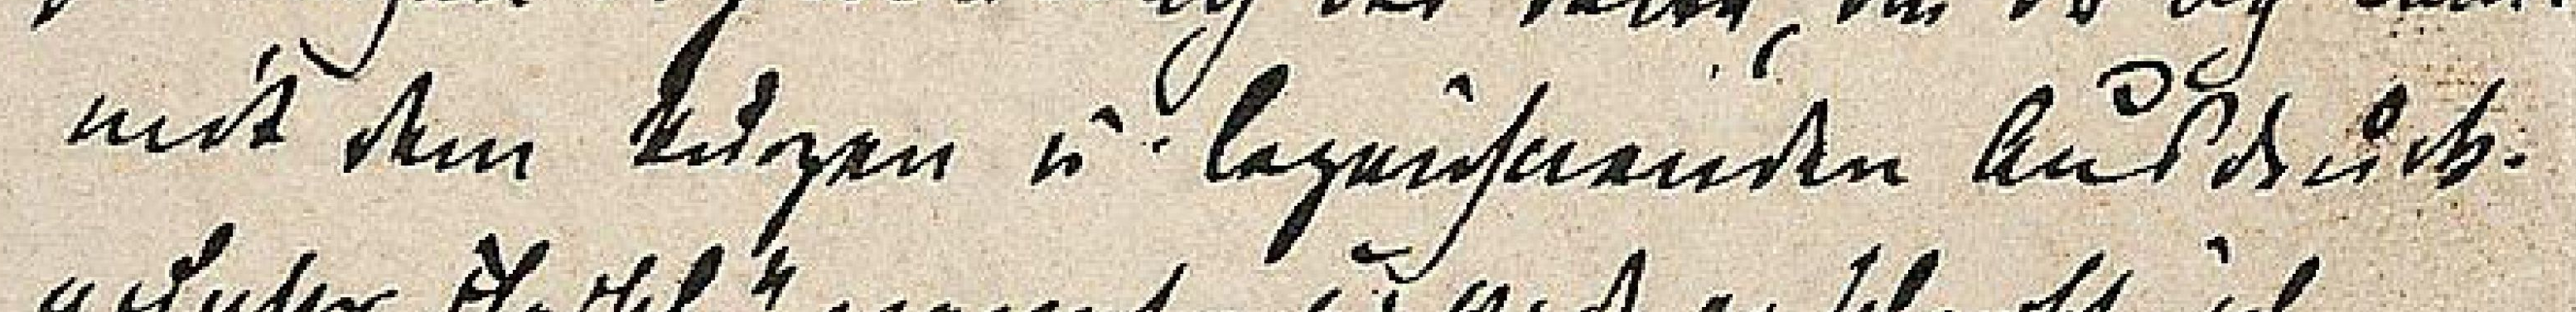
mit dem kurzen u. bezeichnenden Ausdruck.
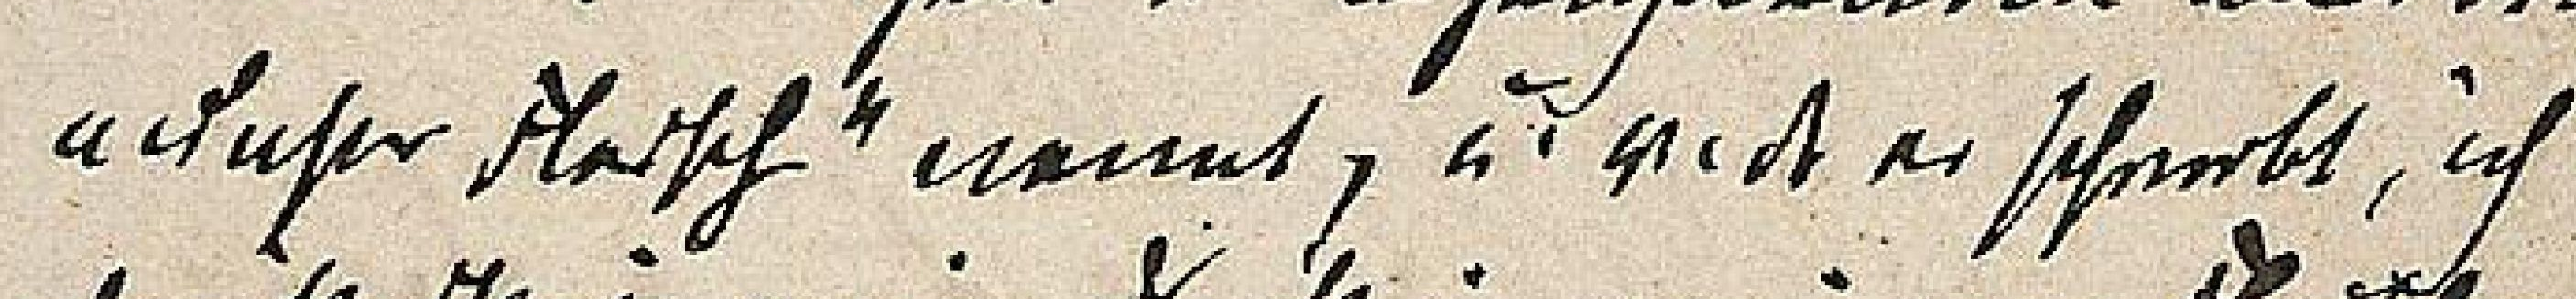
unser Fleisch" nennt, u. v. der er schreibt, ich
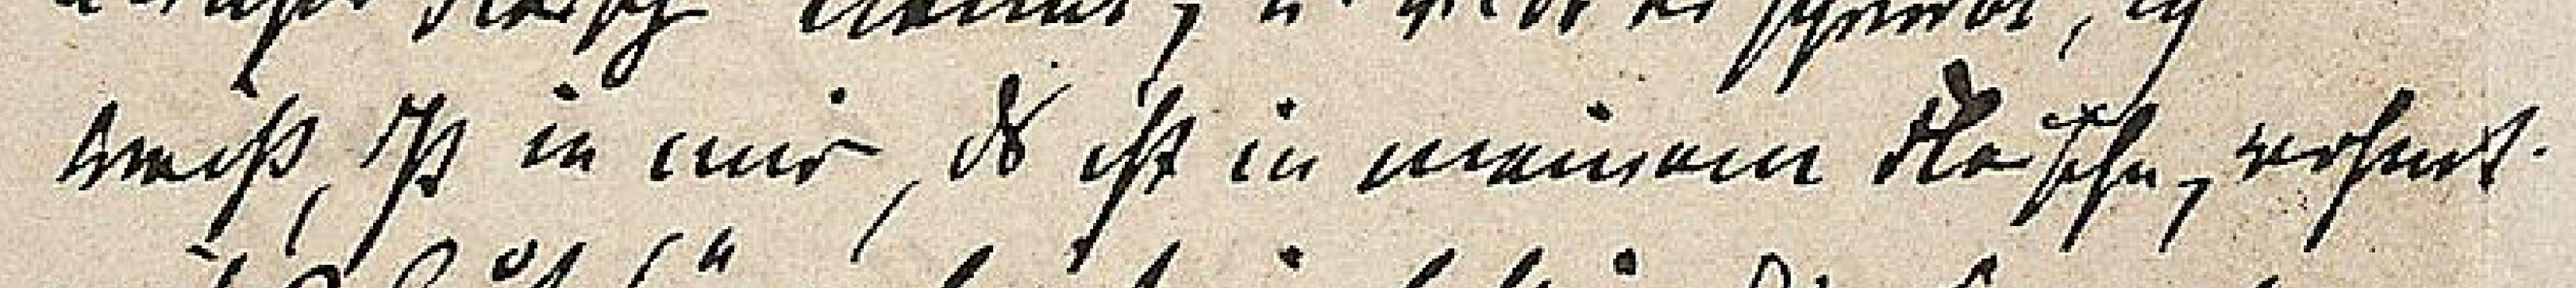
weiß, daß in mir, dß in meinem Fleische, wohnt
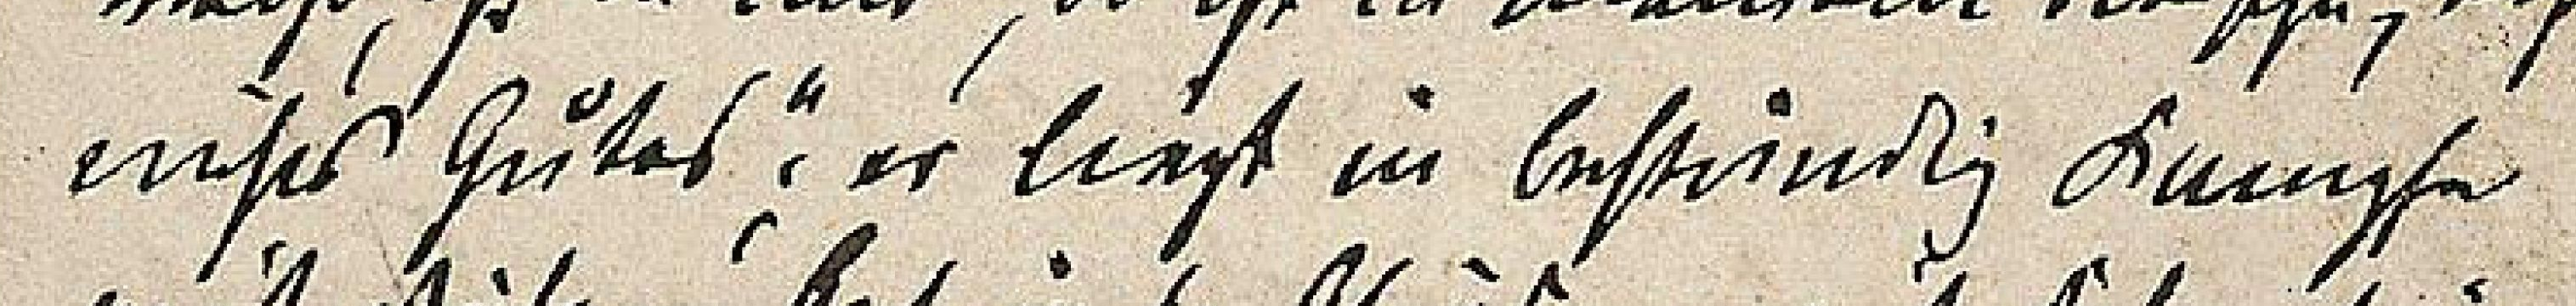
nichts Gutes", er liegt in beständig Kampfe
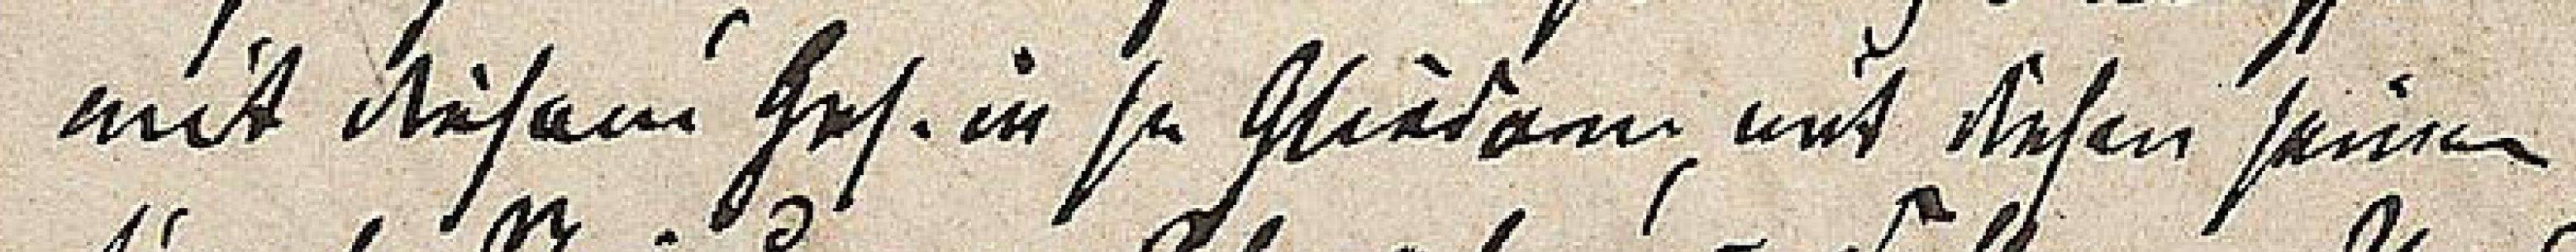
mit diesem Ges. in sn Gliedem, mit diesen seinen
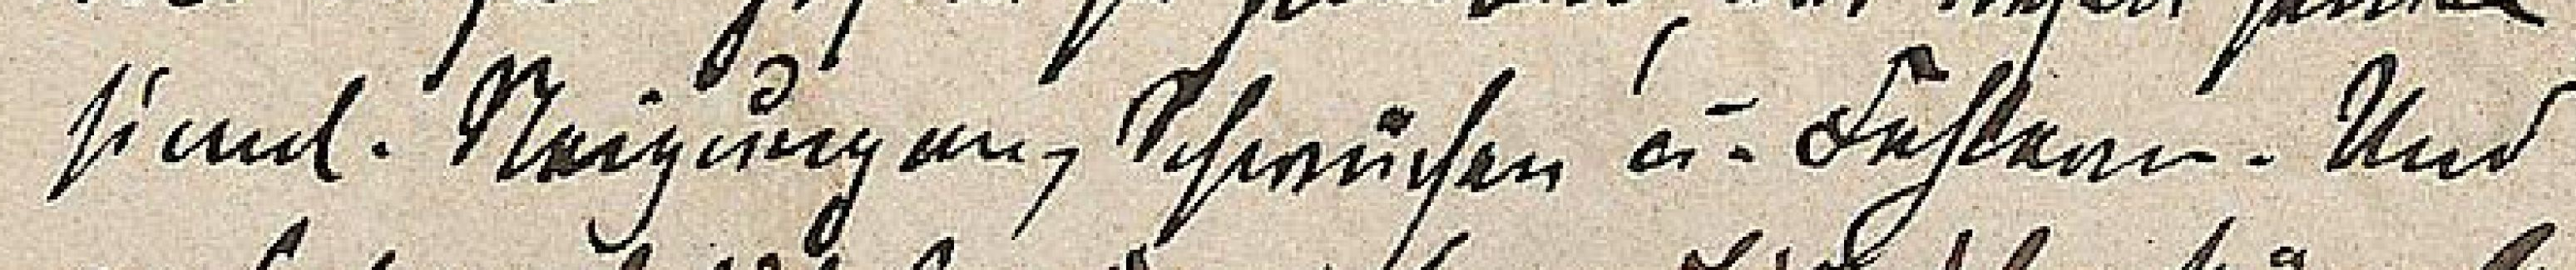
sinnl. Neigungen, Schwächen u. Fehlern. Und
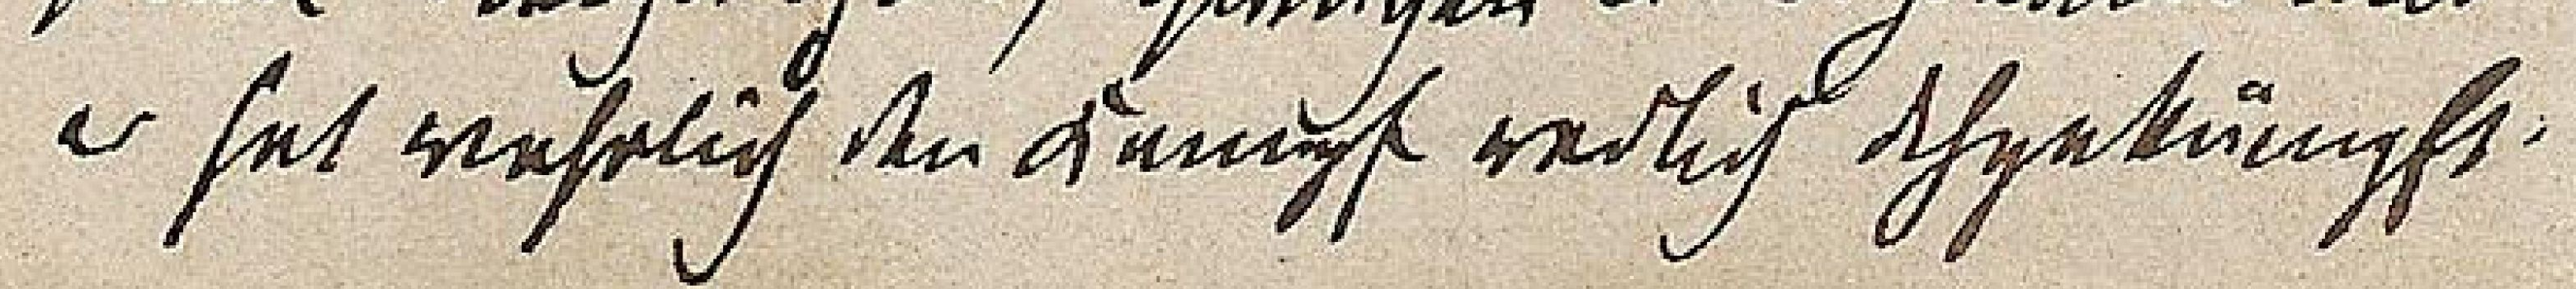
er hat wahrlich den Kampf redlich dchgekämpft.
